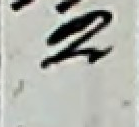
2
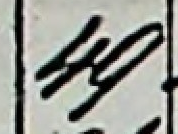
49
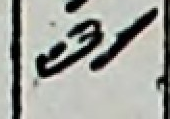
31
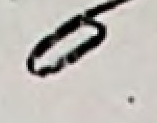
6
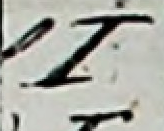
I
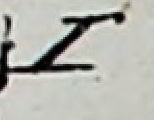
I
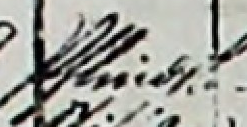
Pflindsb.
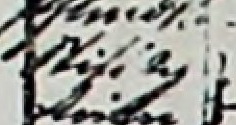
Stiftsg.
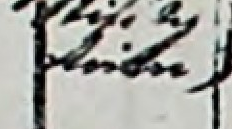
Rain
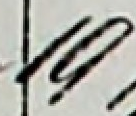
19
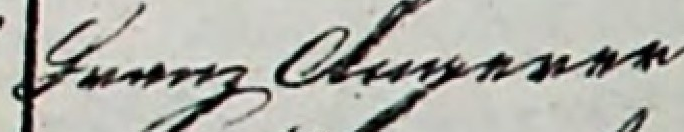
Franz Angerer
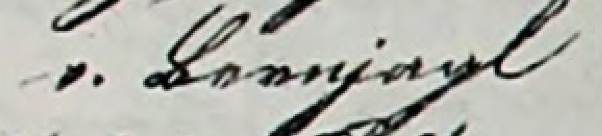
v. Bernjagl
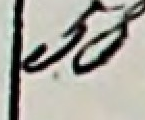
58
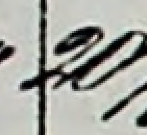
20
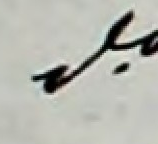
do
